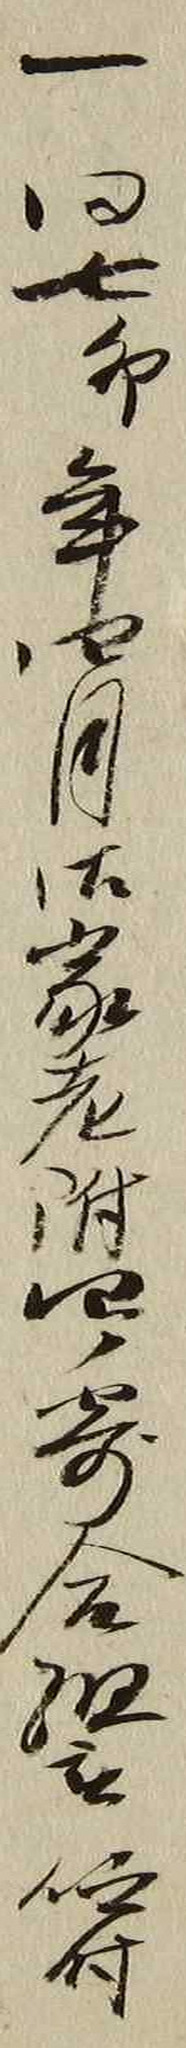一同七卯年四月御家老附四寄合組被仰付
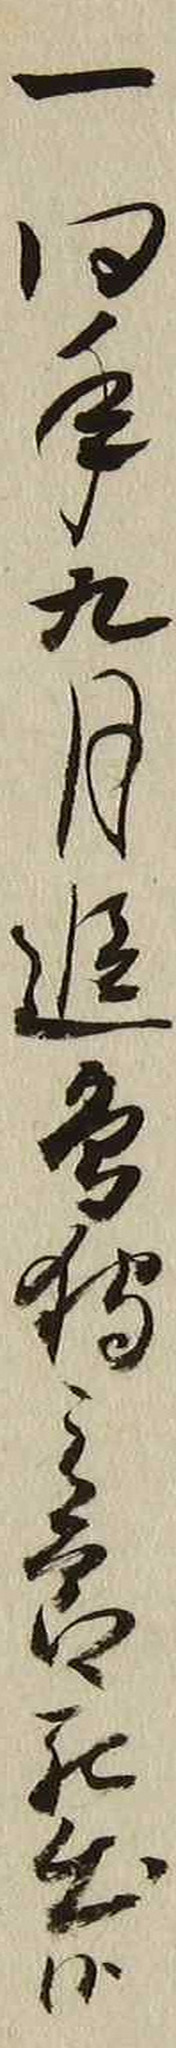一同年九月追鳥狩之節罷出候
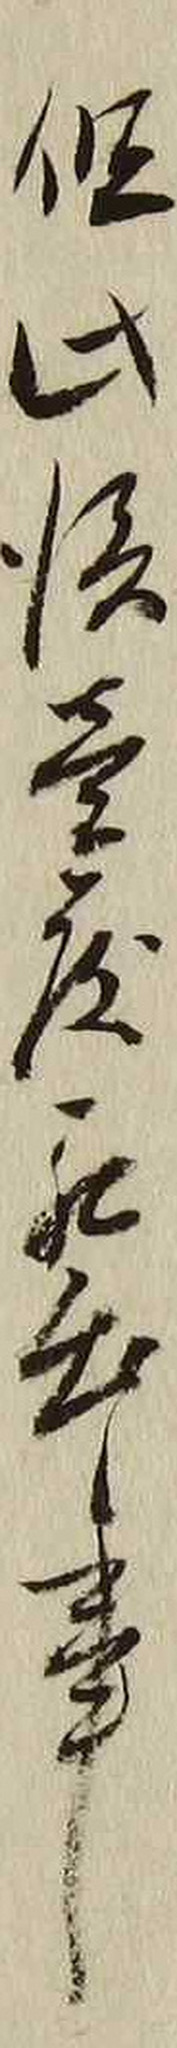但此後壱度罷出候事
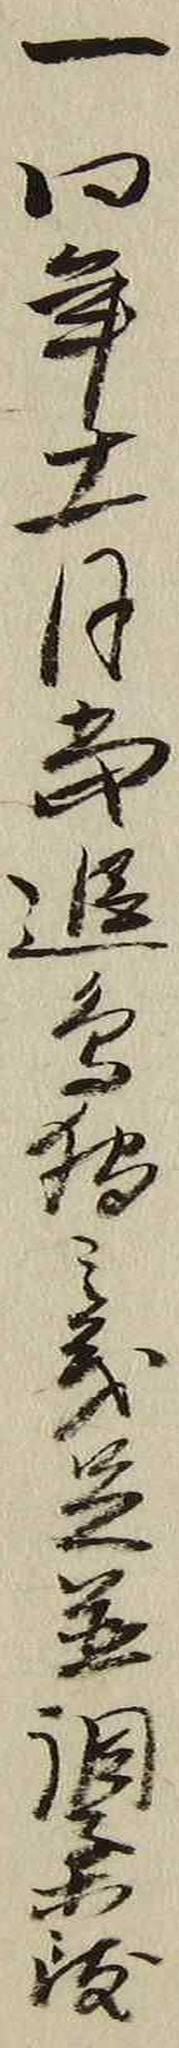一同年十一月当追鳥狩之義足並調子等致
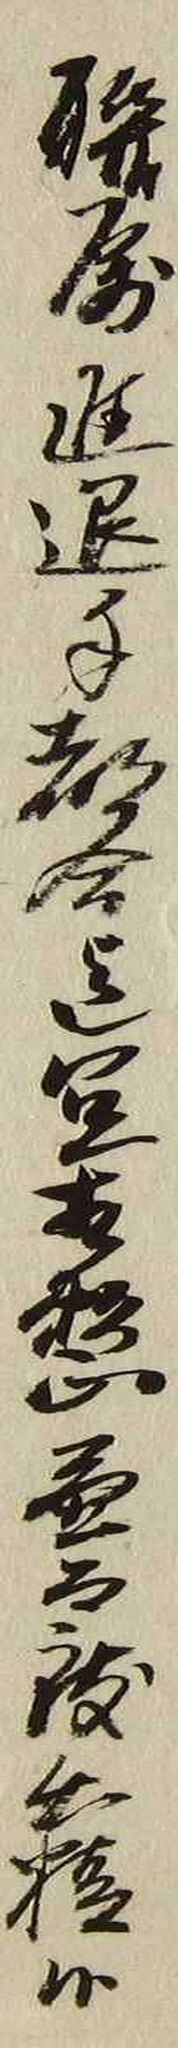聯属進退手都合迄宜相整兼而致出精候
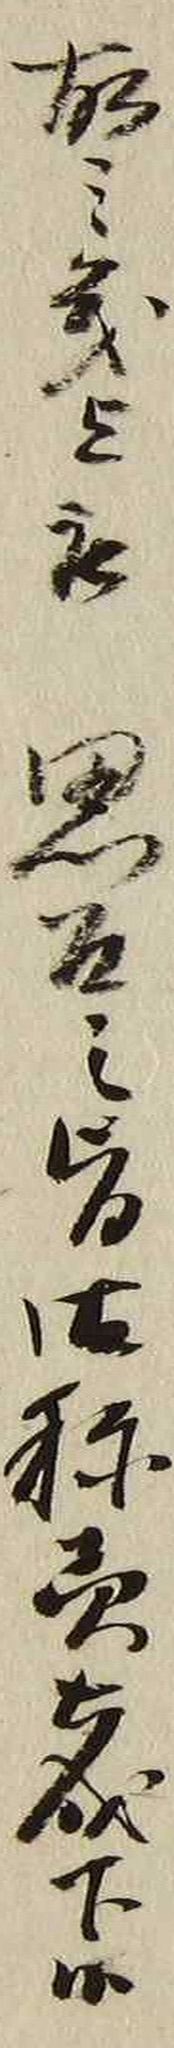故之義与被思召之旨御称美被成下候
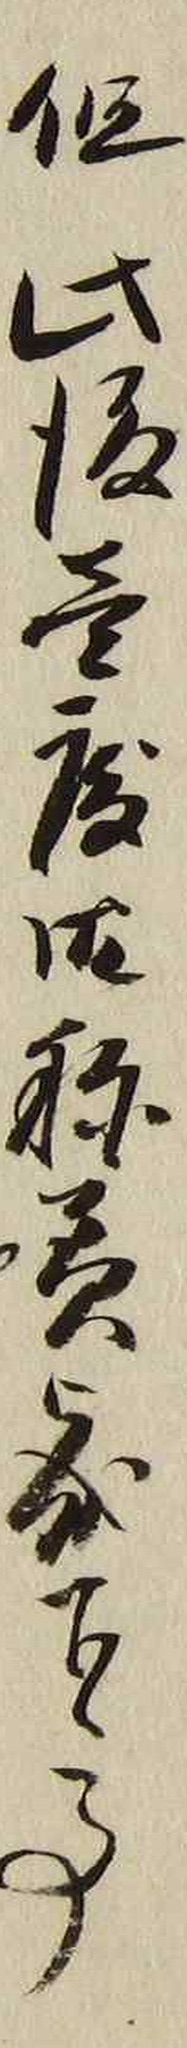但此後壱度御称美被成下候事

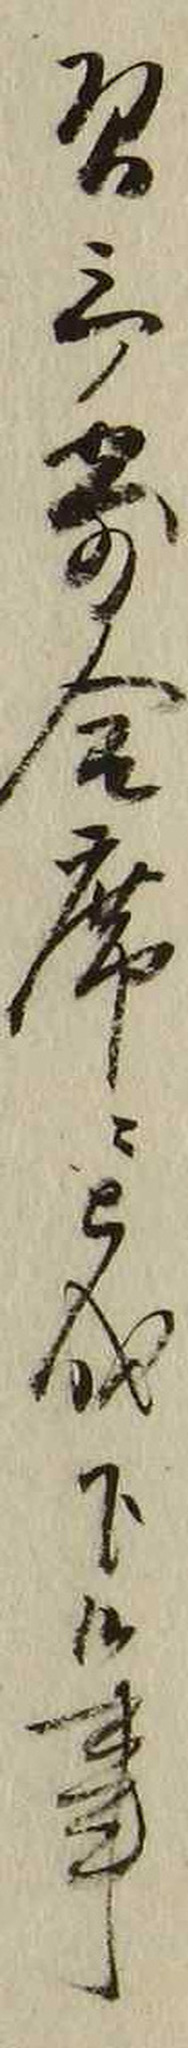習上寄合席被成下候事
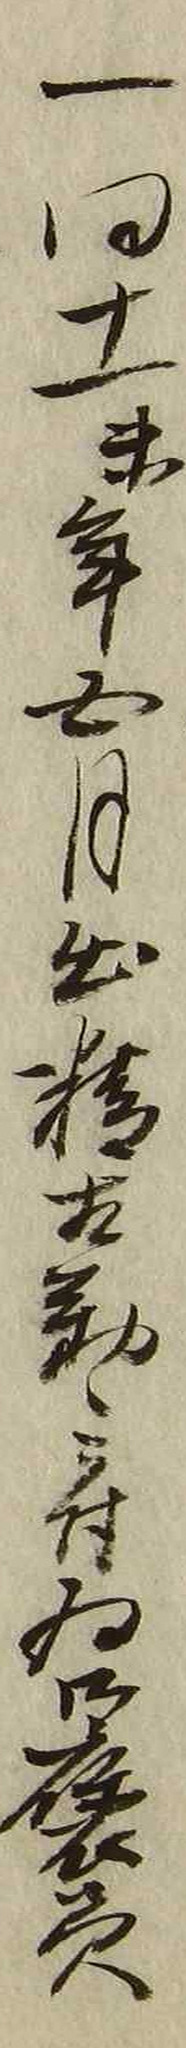一同十一未年五月出精相勤候付為御褒美
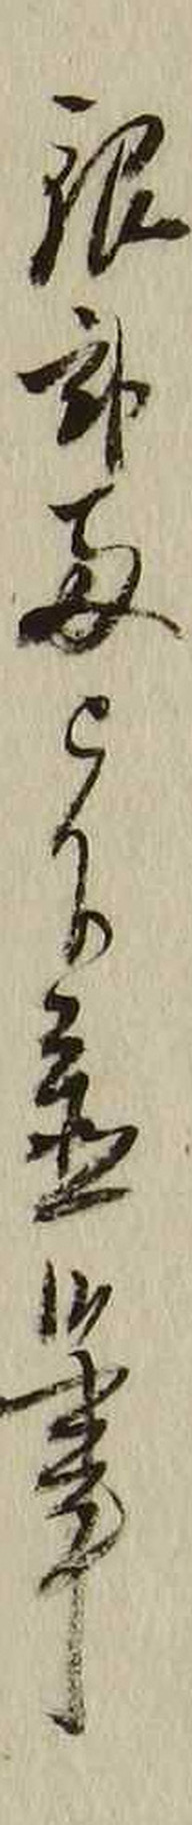銀弐両被下置候事
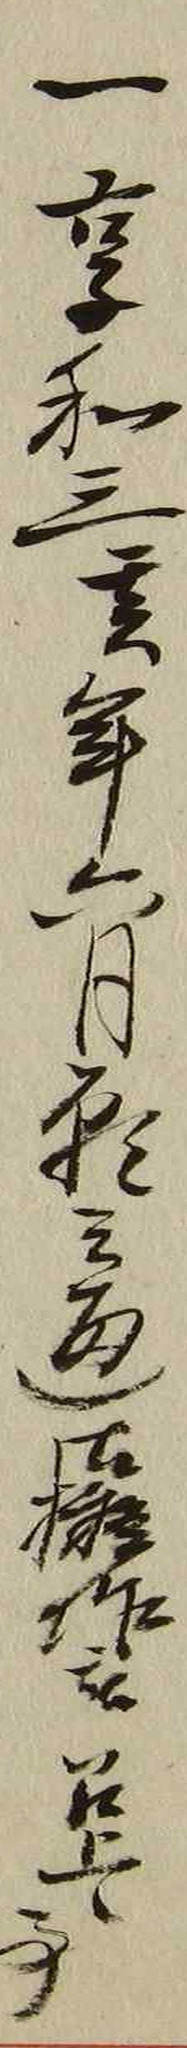一享和三亥年六月願之通御擬作被召上候事
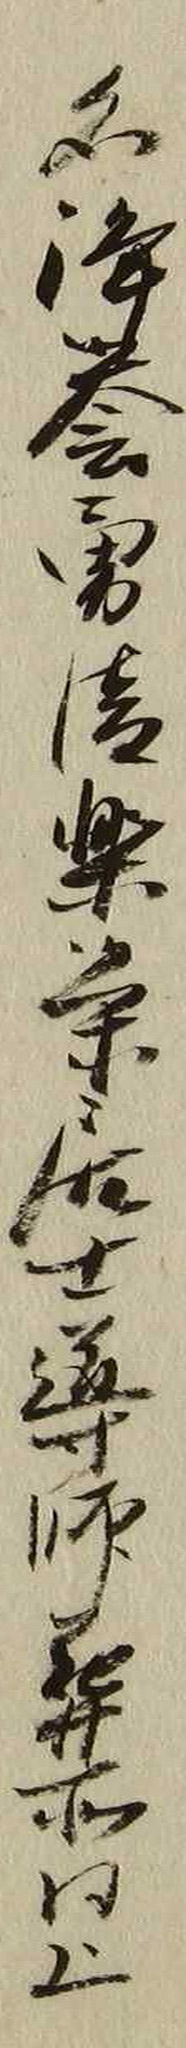名浄誉勇清楽栄居士導師葬所同上
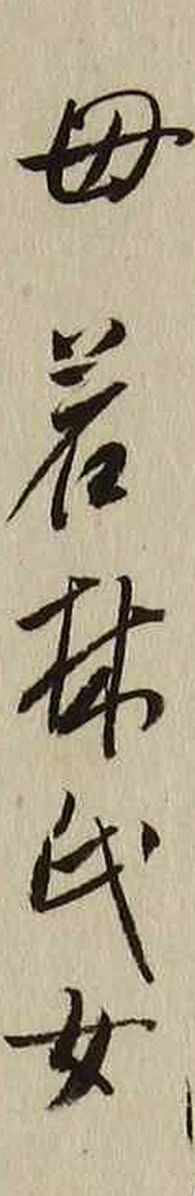母若林氏女
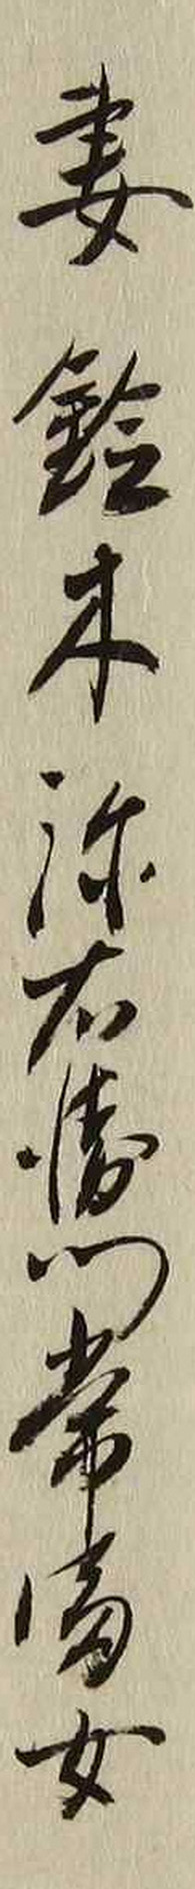妻鈴木弥右衛門常冨女
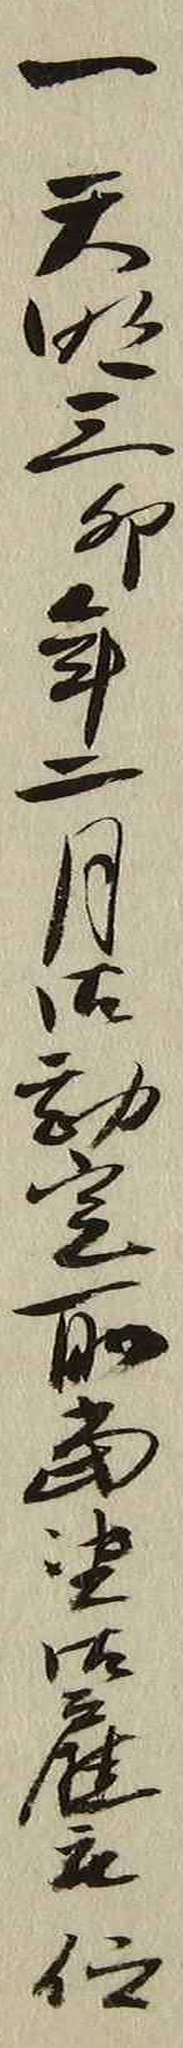一天明三卯年二月御勘定所当坐御雇被仰
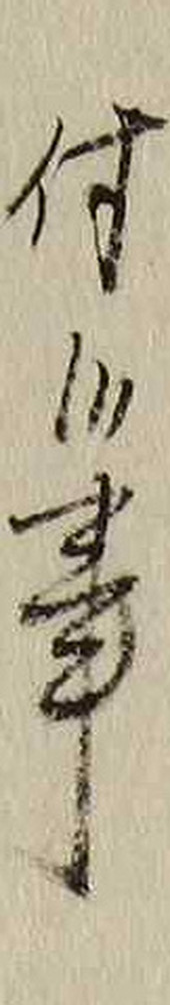付候事
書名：諸士系譜　巻之350　せ之部1冊全
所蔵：会津若松市立会津図書館
